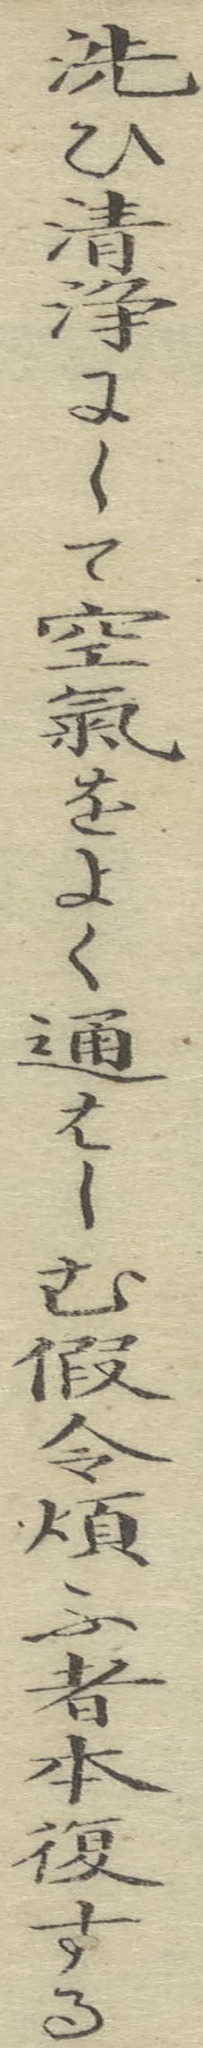洗ひ清浄にして空氣をよく通はしむ假令煩ふ者本復する
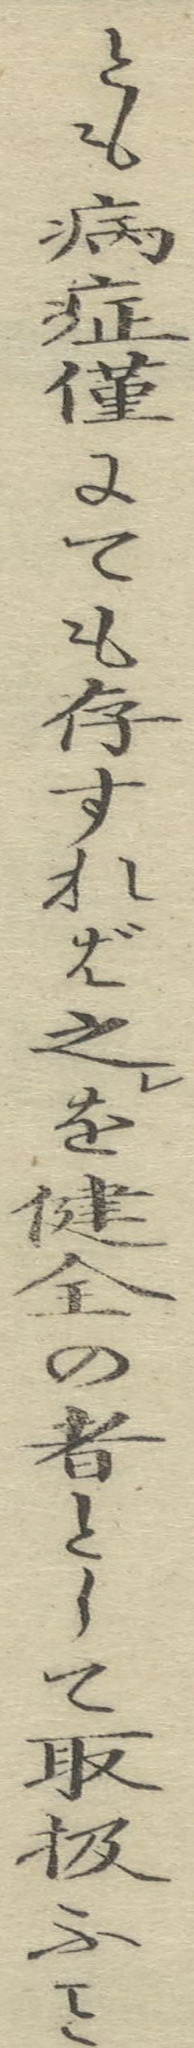とも病症僅にても存すれば之健全の者として取扱ふこと
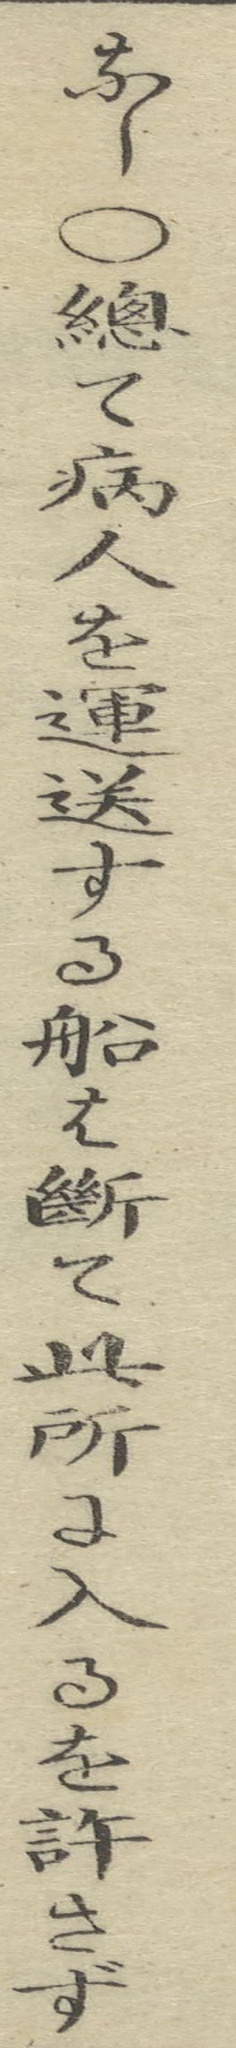なし〇總て病人を運送する船は斷て此所に入るを許さず
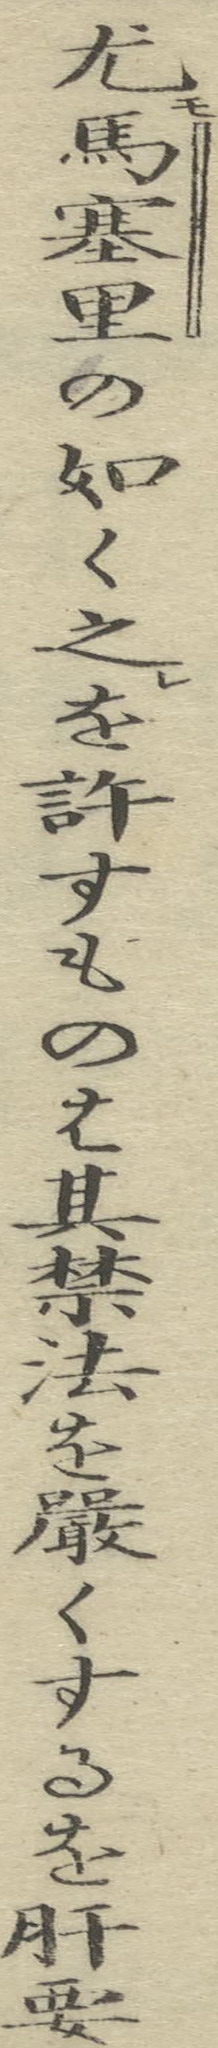尤馬塞里の如く之許すものは其禁法を厳しくするを肝要
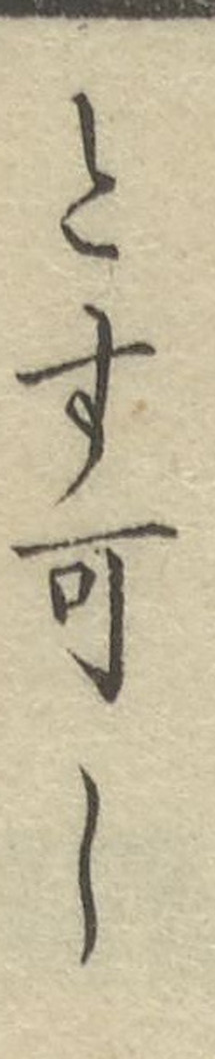とす可し
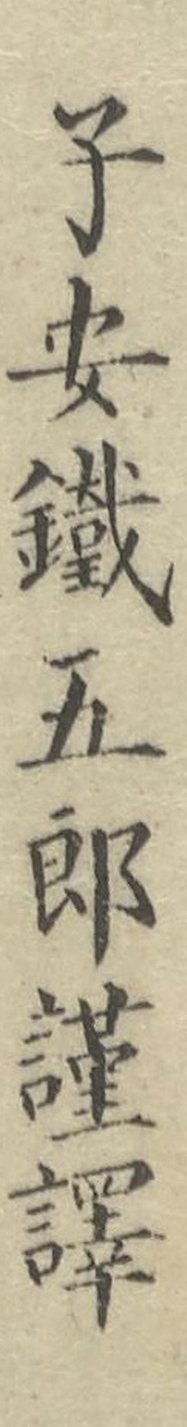子安鐵五郎謹譯

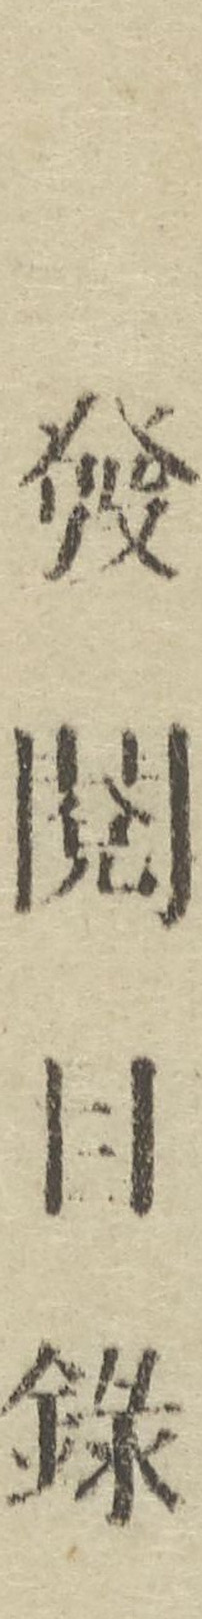發閲目録
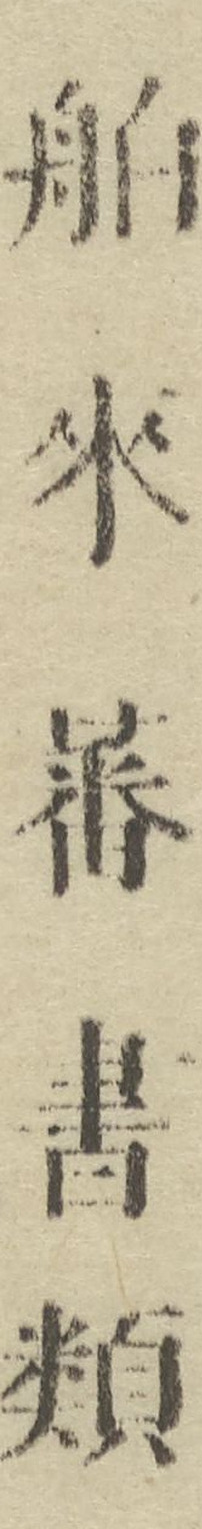舶來番書類
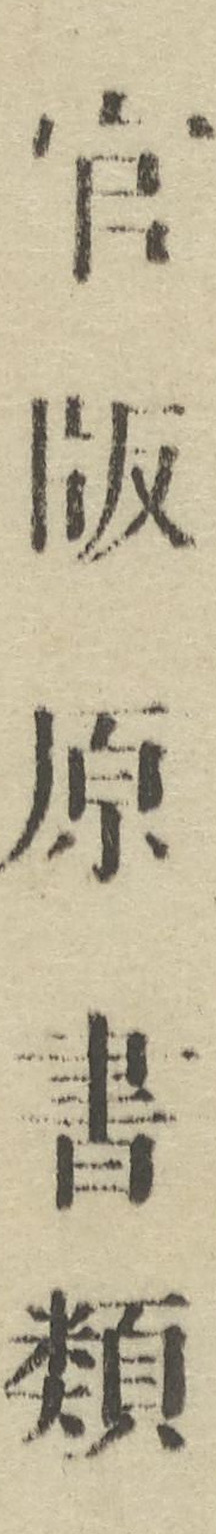官版原書類
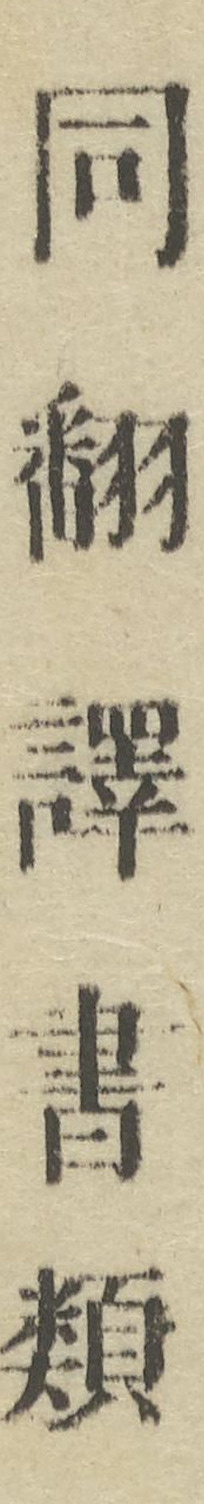同翻譯書類
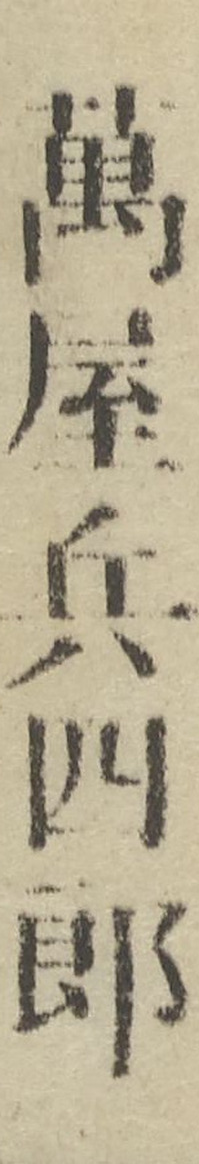萬屋平四郎
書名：官版疫毒預防説　全
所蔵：東京大学総合図書館 General Library in the University of Tokyo, JAPAN
